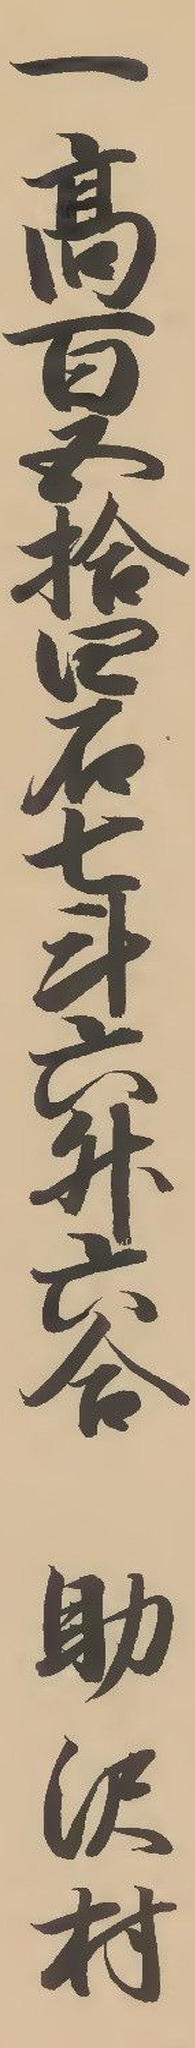一高百五拾四石七斗六升六合助沢村

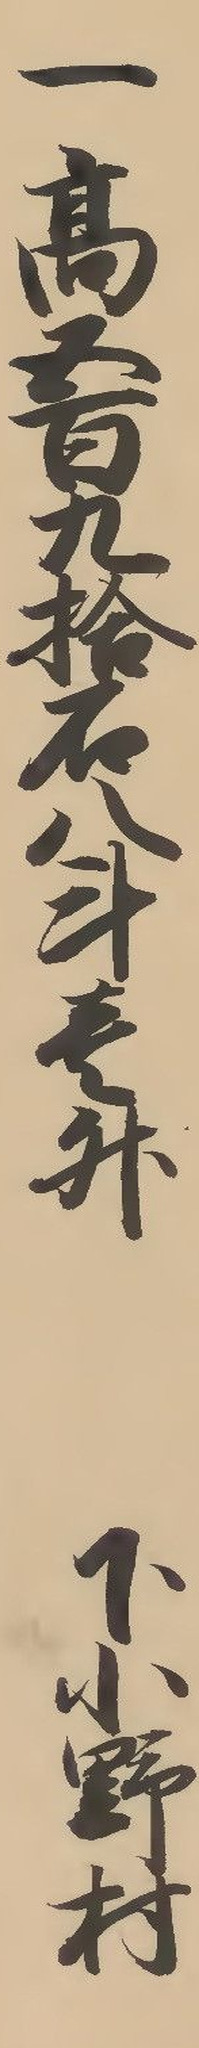一高五百九拾石八斗壱升下小野村
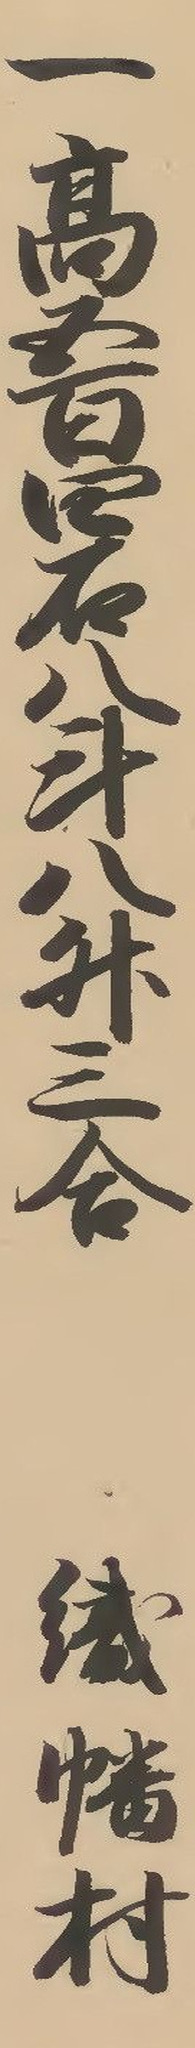一高五百四石八斗八升三合織幡村
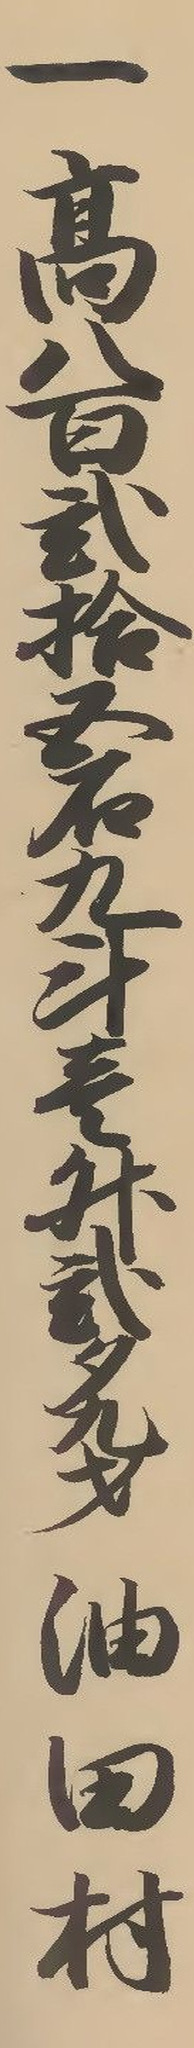一高八百弐拾五石九斗壱升弐勺九才油田村
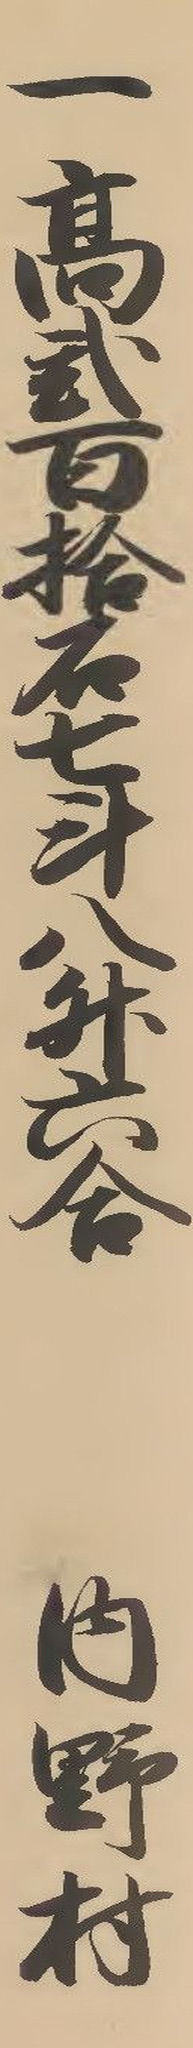一高弐百拾石七斗八升六合内野村
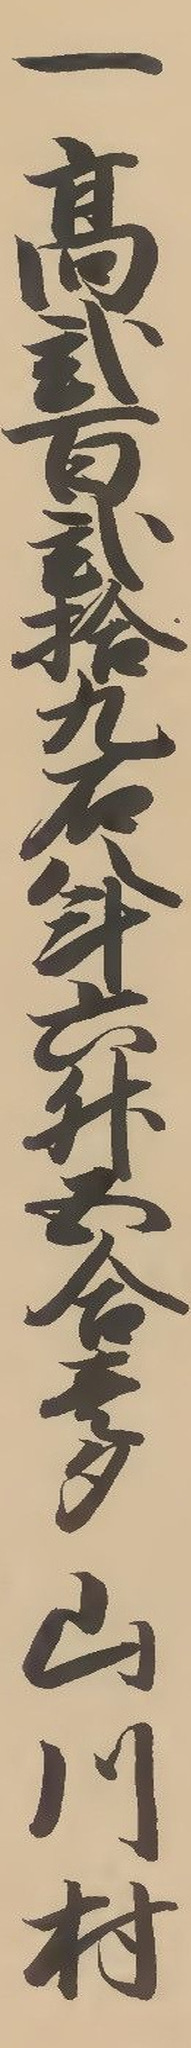一高弐百弐拾九石八斗六升五合壱勺山川村
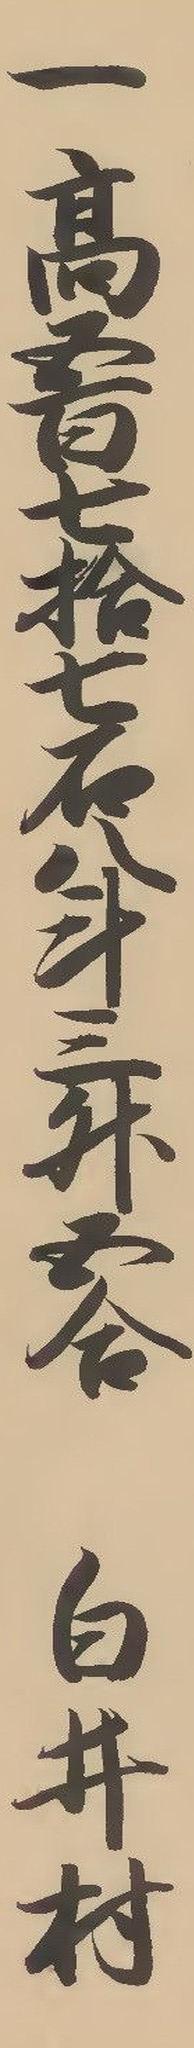一高五百七拾七石八斗三升五合白井村

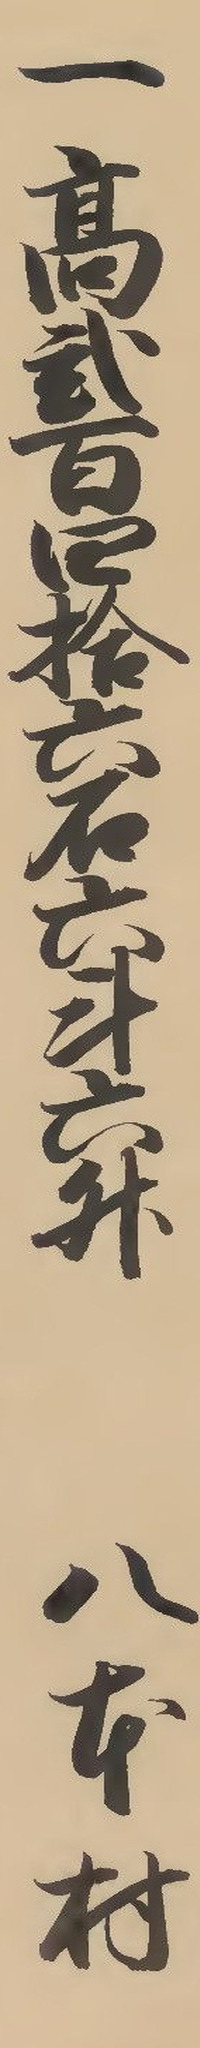一高弐百四拾六石六斗六升八本村
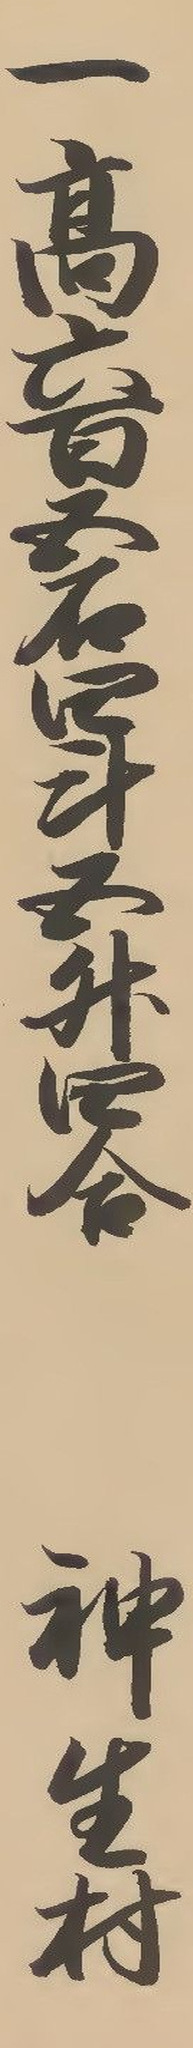一高六百五石四斗五升四合神生村
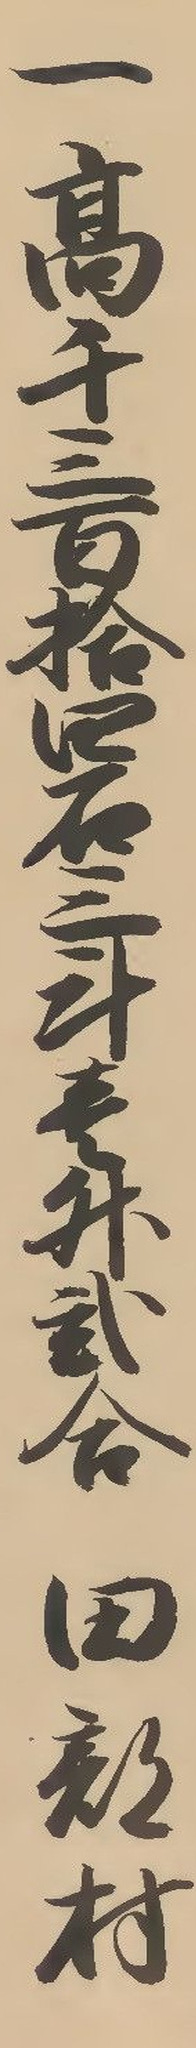一高千三百拾四石三斗壱升弐合田部村
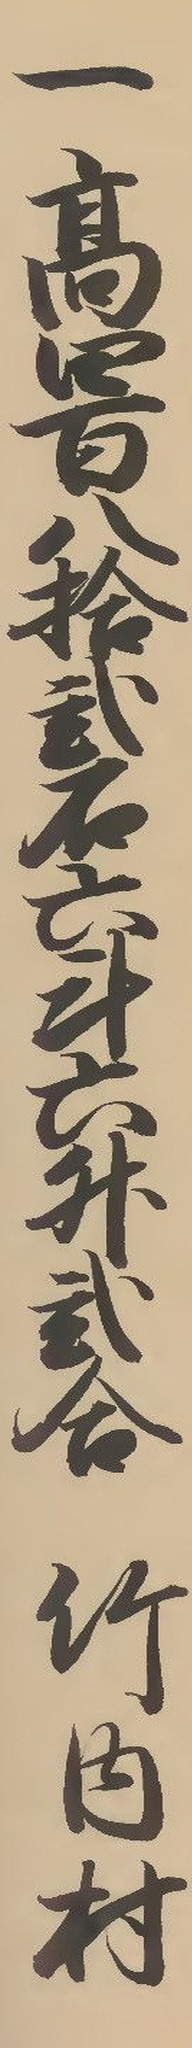一高四百八拾弐石六斗六升弐合竹内村
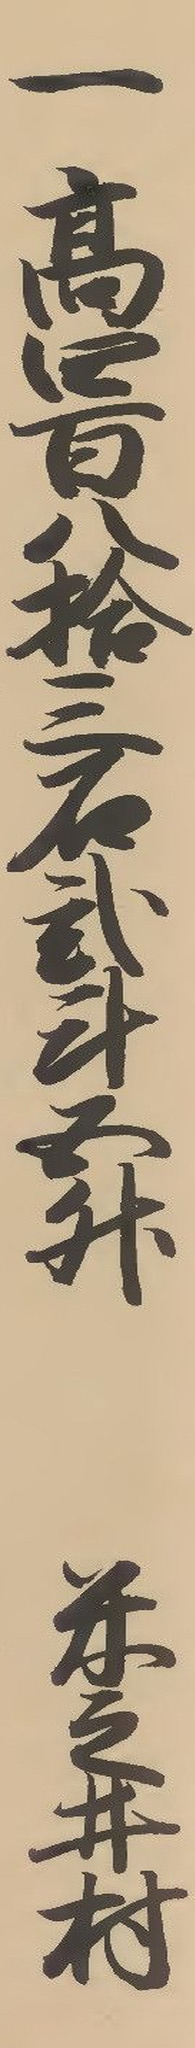一高四百八拾三石弐斗五升米之井村
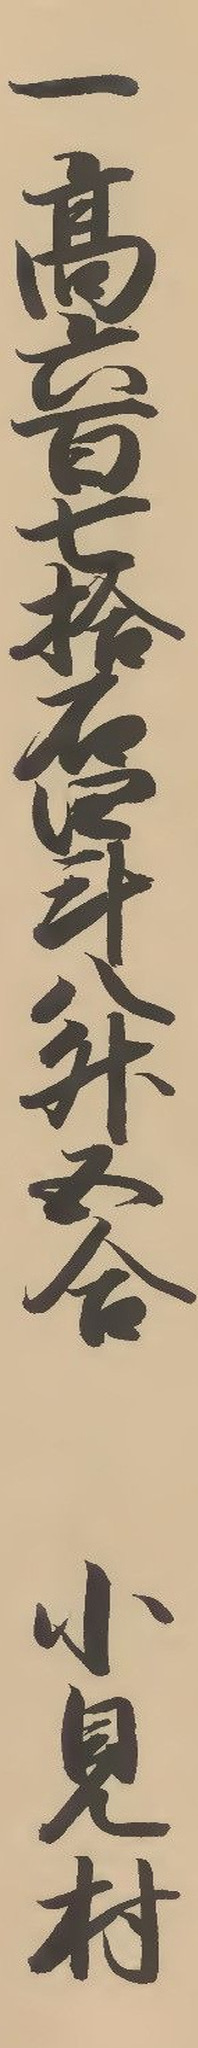一高六百七拾石四斗八升五合小見村
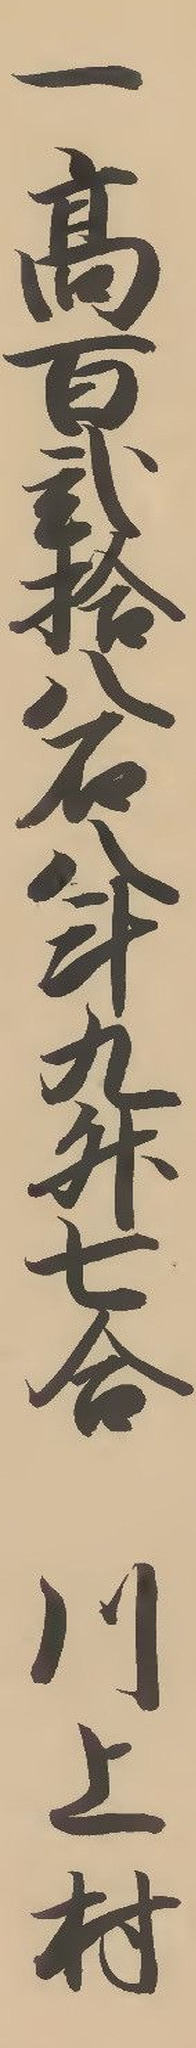一高百弐拾八石八斗九升七合川上村
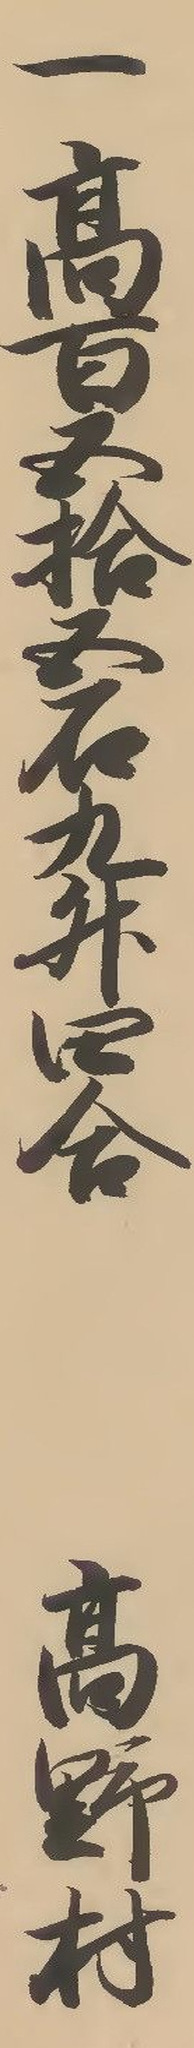一高百五拾五石九升四合高野村

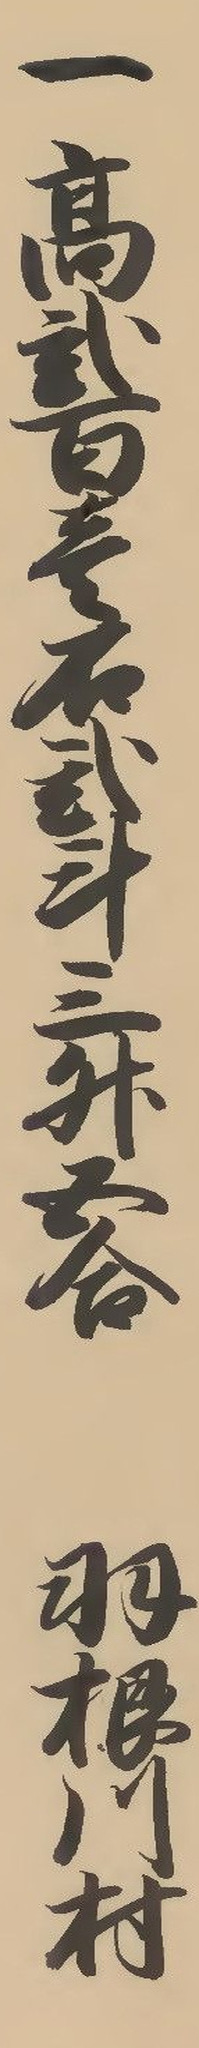一高弐百壱石弐斗三升五合羽根川村
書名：下総国郷帳
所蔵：国立公文書館 National Archives of Japan
